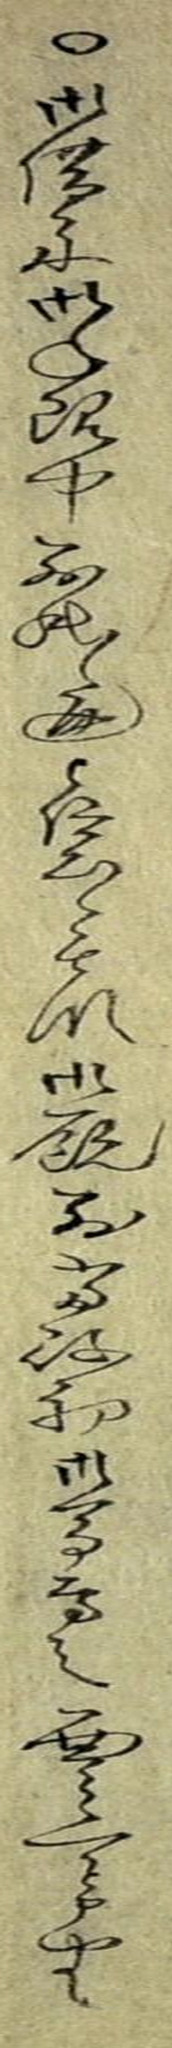○御借米御年限中別紙之通被仰出候其段御厩別当役初御馬高之面々へ可被申聞候
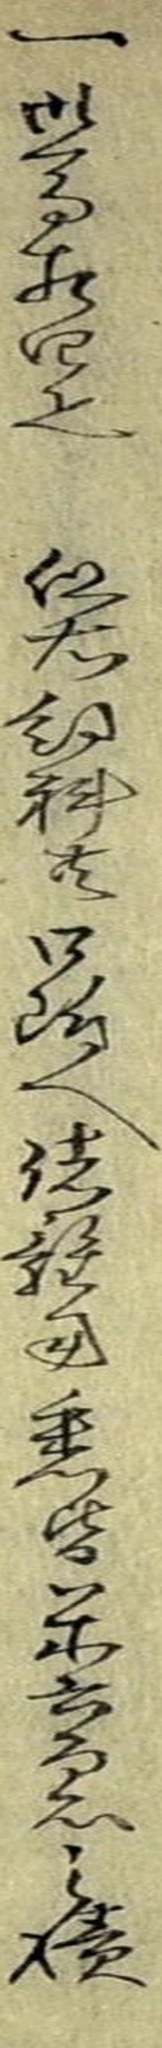一御馬拾四疋但右飼料共目附人諸雑用悉皆米六百石之積
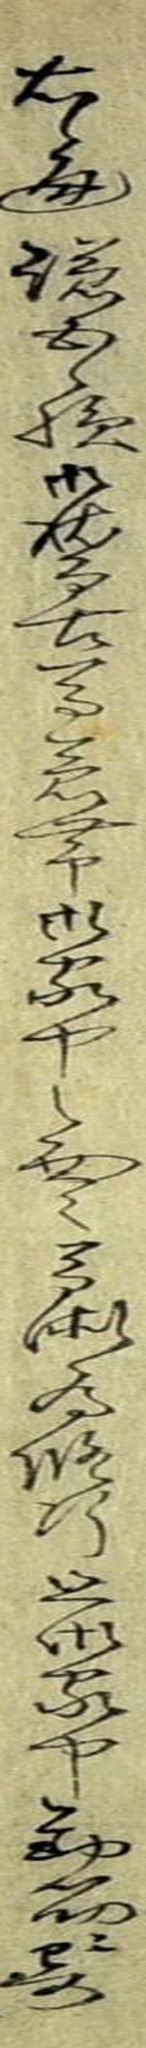右之通謙五郎候様御稽古馬兼帯御家中之面々馬術修行且御家中勤筋ニ寄
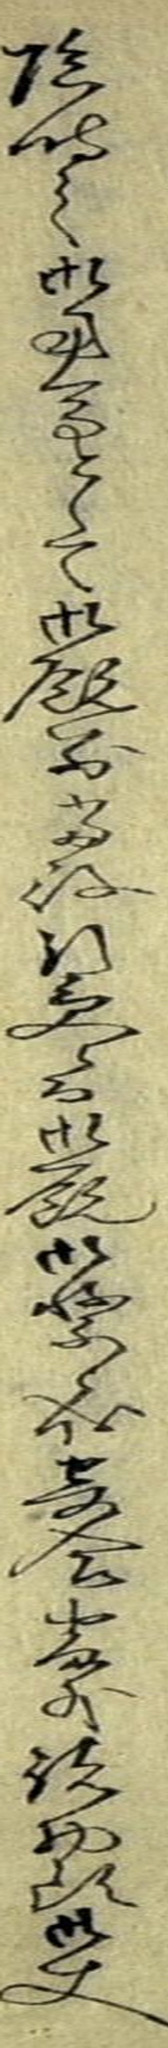臨時之御用馬として御厩別当役引受候而御厩御繋被成寄合番外諸物頭御使
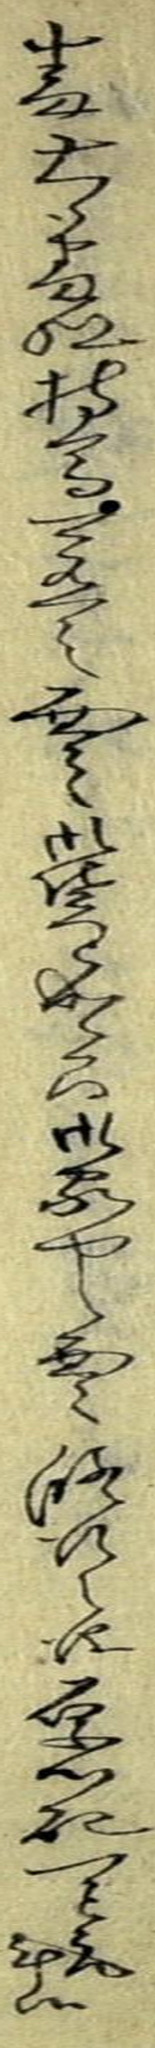番大御番組持馬可有之面々御貸被成候間御家中之面々修行之儀厚心配可被取計候

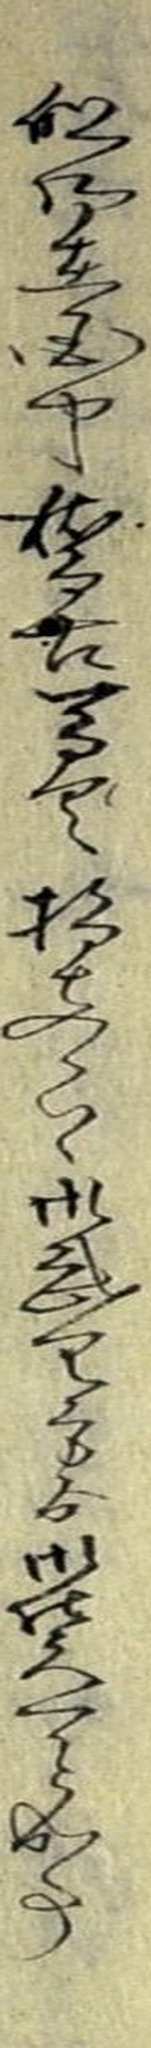但御在国中稽古馬具指支候ハヽ御武具方ゟ御貸可被成事
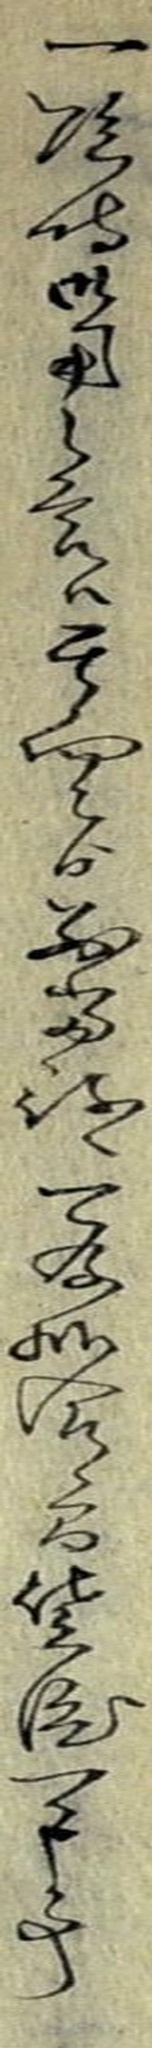一臨時御用之節ハ其向々ゟ別当役へ可及掛合候間貸渡可申事
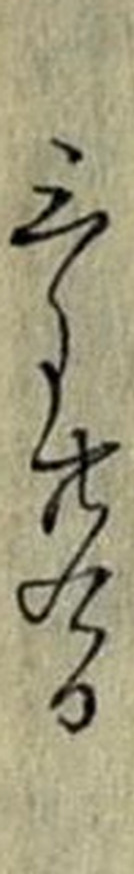三月廿九日
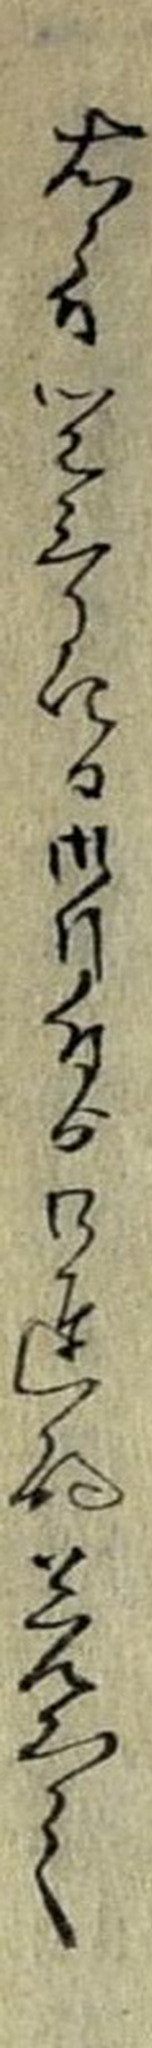右ニ付閏参月四日御目付ゟ口達触差出之
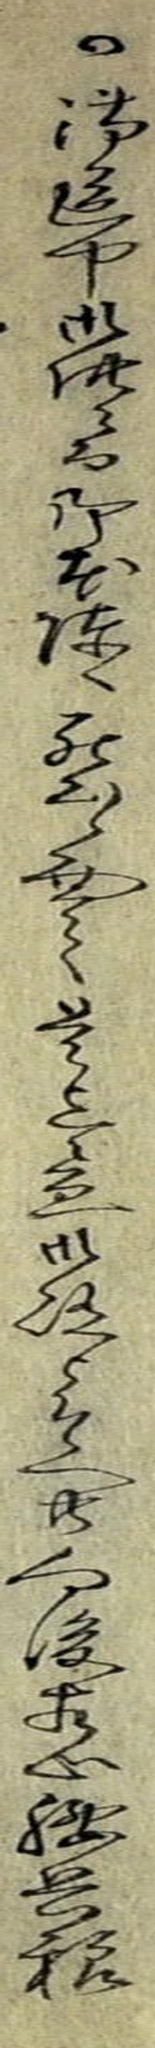○御道中御供ニ而御本陣へ罷出候面々へ是迄ニ宜御賄被下候へ共向後相止腰兵粮
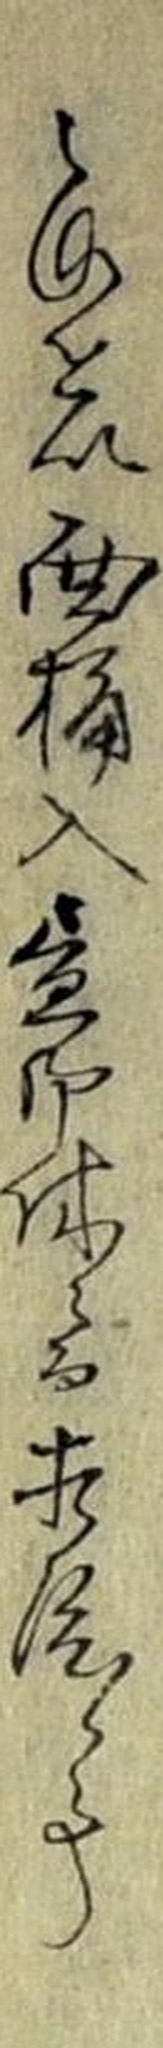之趣を以面桶入昼御休ニ而相渡候事
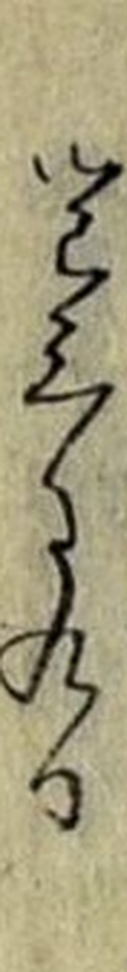閏三月九日
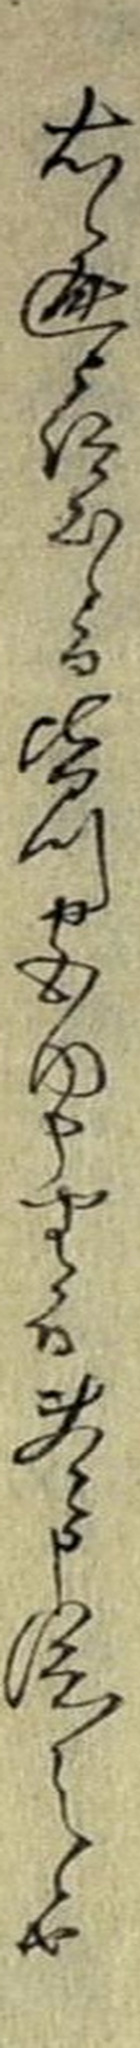右之通被仰出候旨皆川宮内申聞ニ付夫々申渡之候由
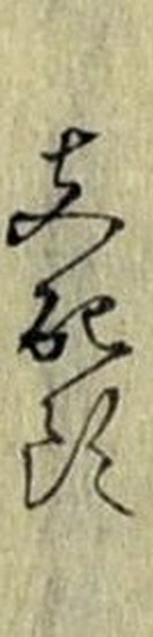支配頭
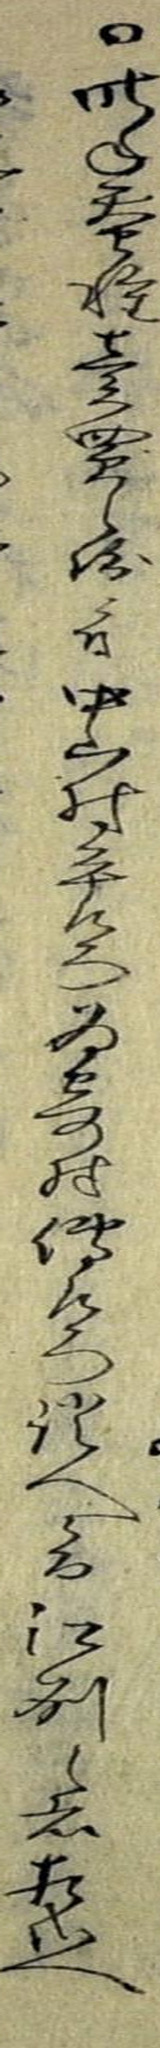○昨年蚕種売買之儀ニ付中山村平左衛門為寄村伝左衛門証人ニ而江州之者拾弐人
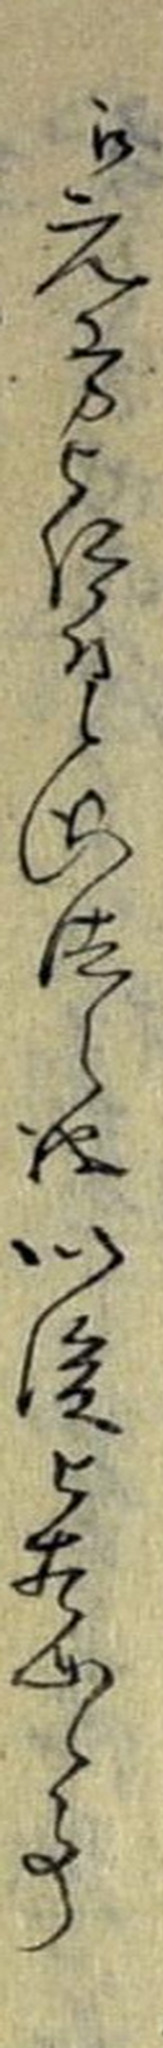江元方被仰付之趣法之儀以後被相止候事
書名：命令之部 五
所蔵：福井県文書館 Fukui Prefectural Archives
